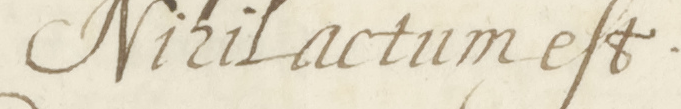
Nihil actum est.
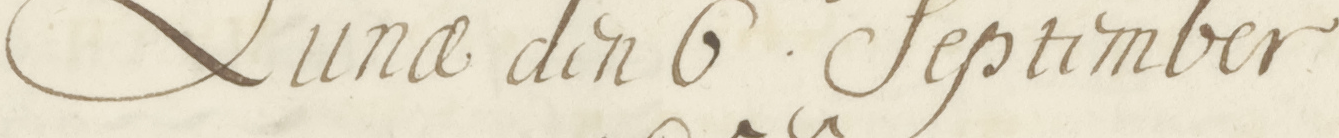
Lunæ den 6en. September
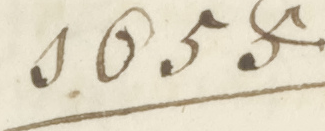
1655.
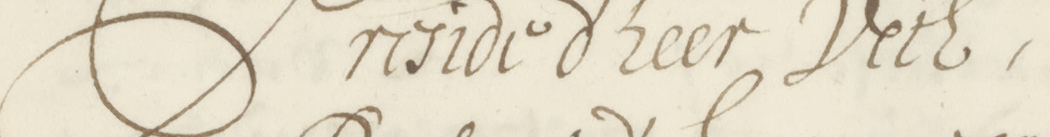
Preside d‛heer Veth,
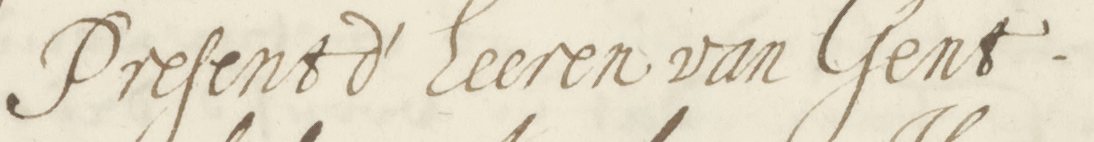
Present d‛heeren van Gent,
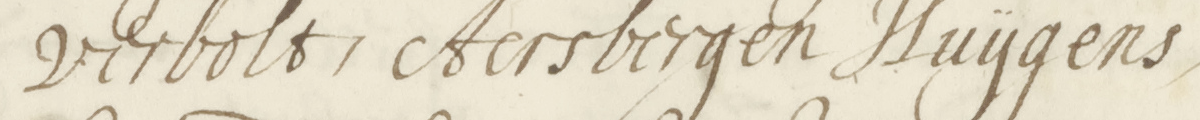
verbolt, Aersbergen, Huijgens,
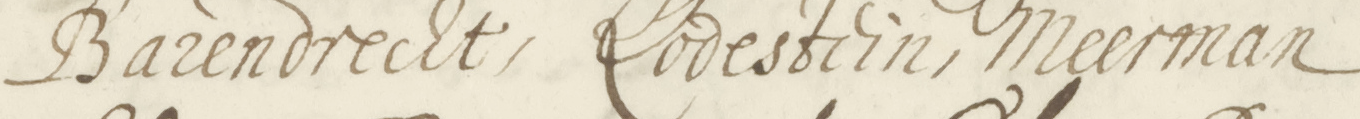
Barendrecht, Lodestein, Meerman,
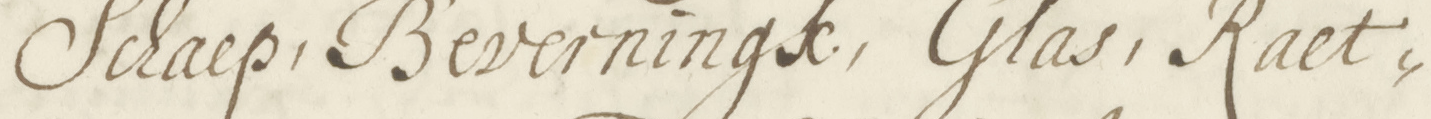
Schaep, Beverningk, Glas, Raet,
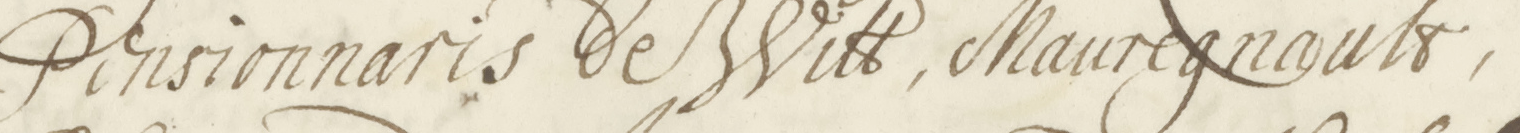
Pensionnaris de Witt, Mauregnault,
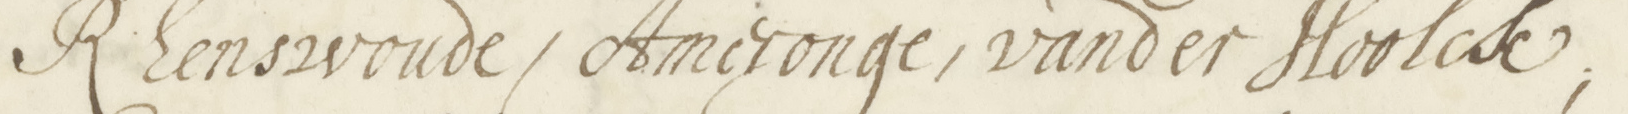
Rhenswoude, Ameronge, vander Hoolck,
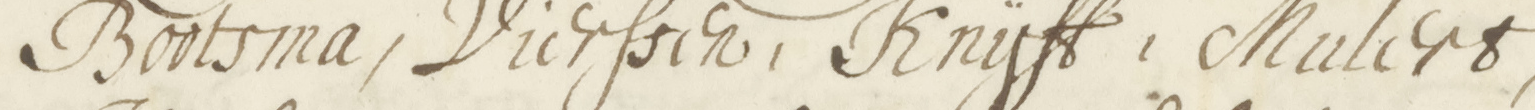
Bootsma, Vierssen, Knijff, Mulert,
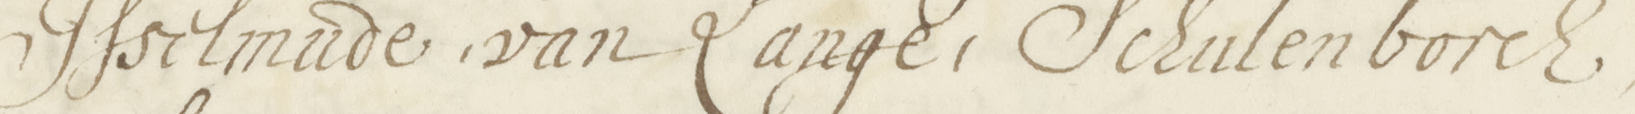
Isselmude, van Lange, Schulenborch,
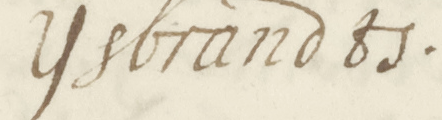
Ysbrandts.
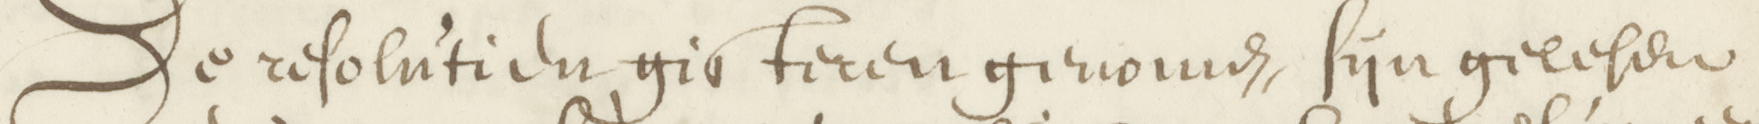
De resolutien gisteren genomen, sijn gelesen
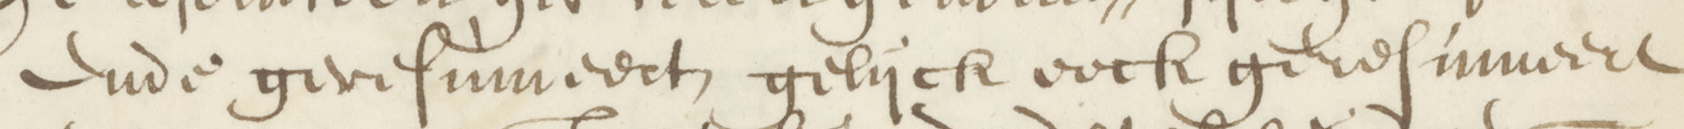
ende geresumeert, gelijck oock geresumeert
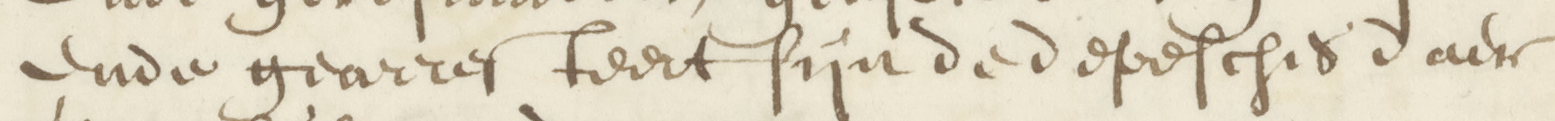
ende gearresteert sijn de depesches daer
